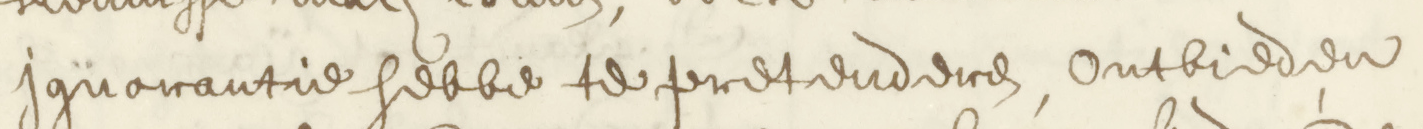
Ignorantie hebbe te pretenderen, ontbieden
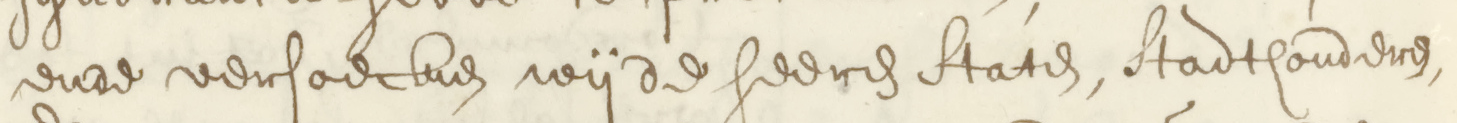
ende versoecken wij de heeren Staten, Stadthouderen,
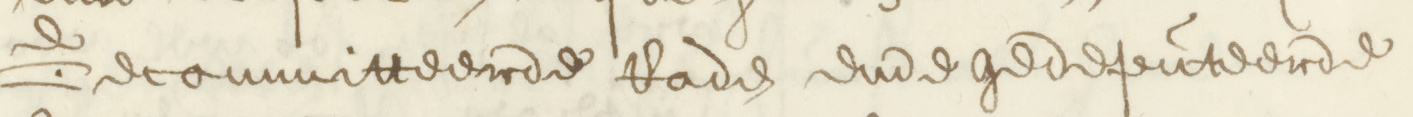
Gecommitteerde Raden ende gedeputeerde
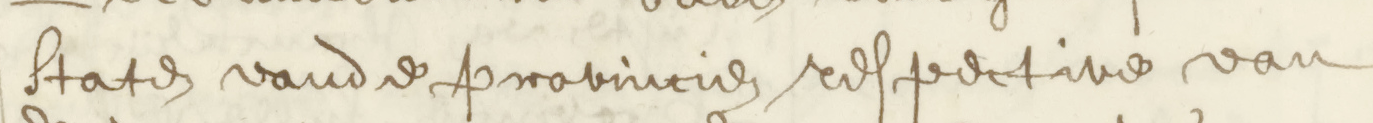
Staten vande provincien respective van
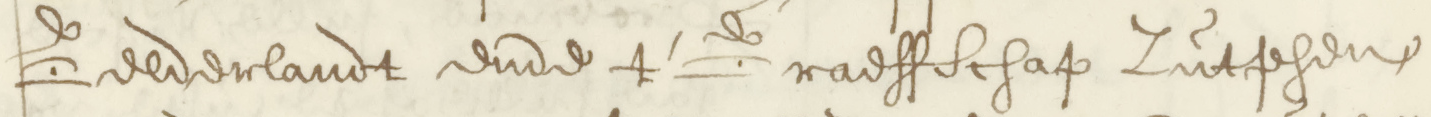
Gelderlandt ende t' Graeffschap Zutphen,
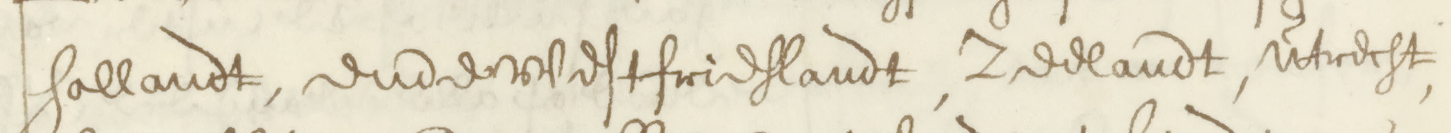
hollandt, ende Westfrieslandt, Zeelandt, Utrecht,
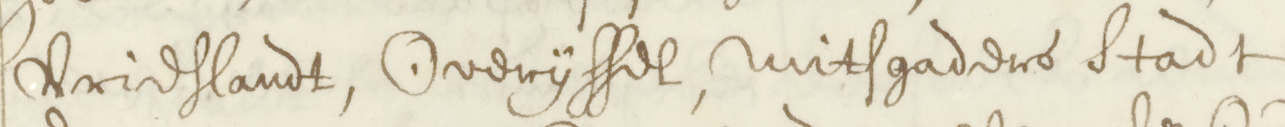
Vrieslandt, Overijssel, mitsgaders Stadt
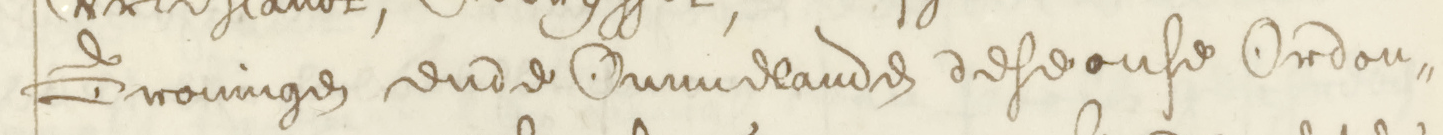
Groningen ende Ommelanden dese onse Ordon„
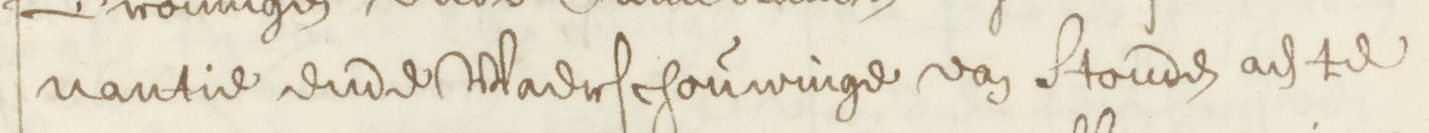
nantie ende Waerschouwinge van stonden aen te
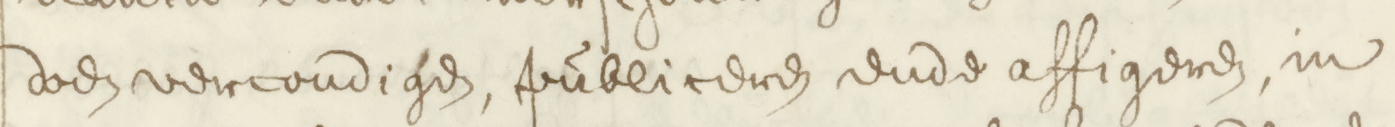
doen vercondigen, publiceren ende affigeren, in
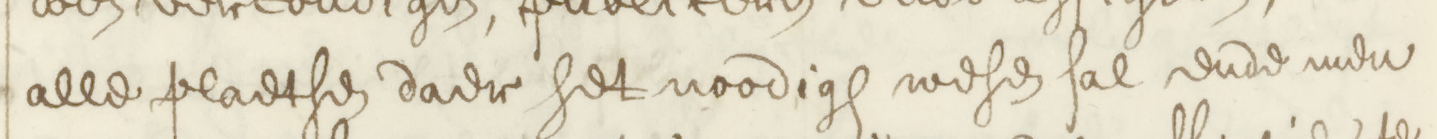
alle plaetsen daer het noodigh wesen sal ende men
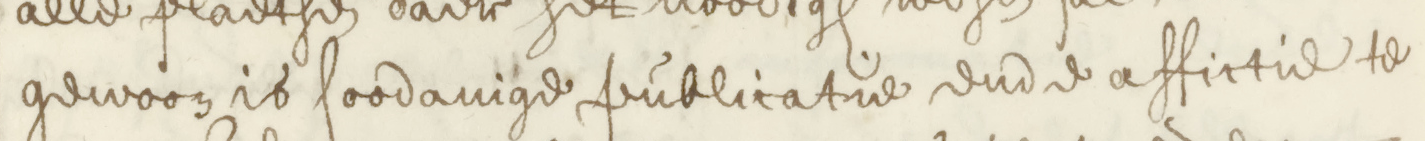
gewoon is soodanige publicatie ende affictie te
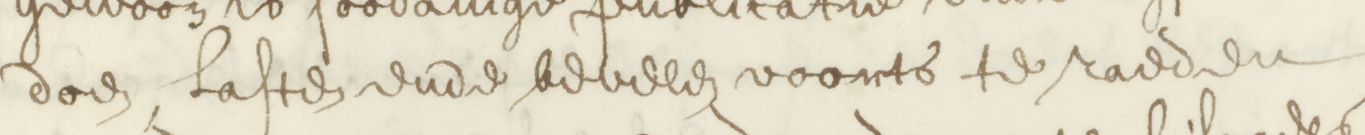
doen, lasten ende bevelen voorts te raeden
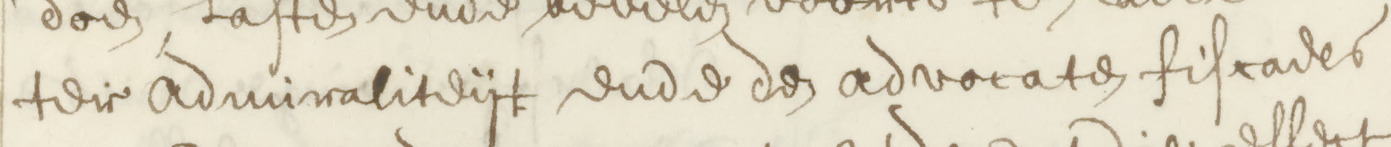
ter Admiraliteijt ende den advocaten fiscaels
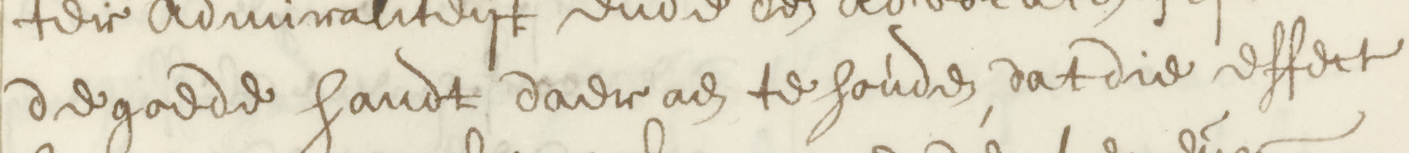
de goede handt daer aen te houden, dat die effect
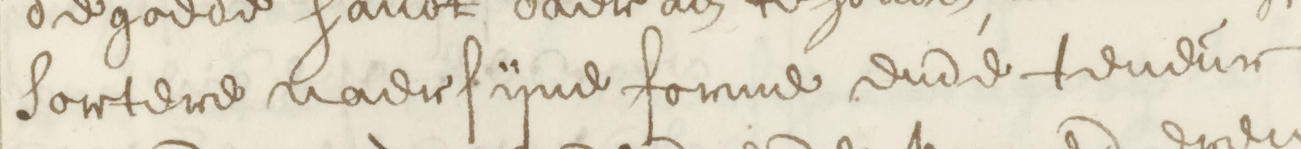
sortere naer sijne forme ende teneur
